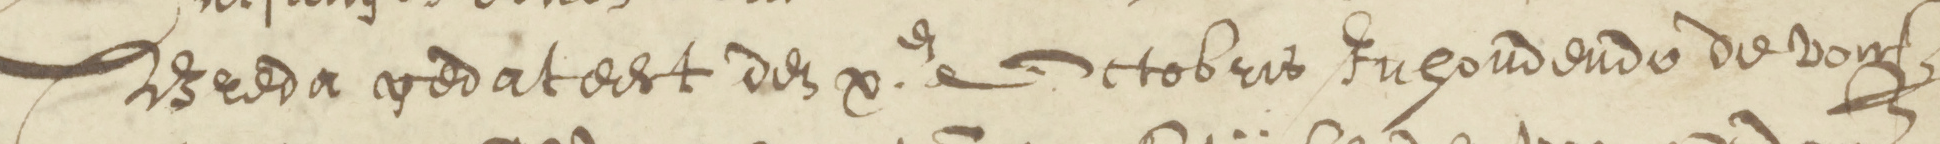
Breda gedateert den xen. Octobris inhoudende de voirs
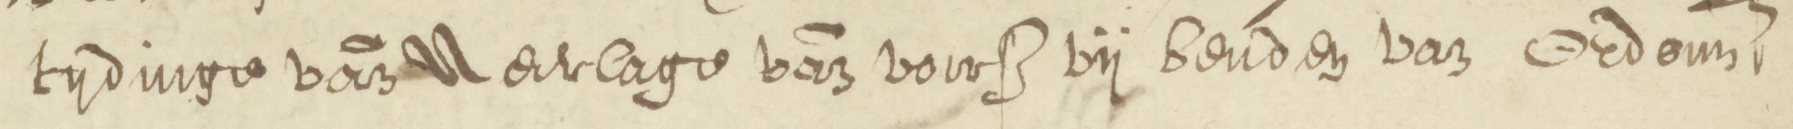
tydinge van Neerlage van voirs vij benden van Ordonn„
